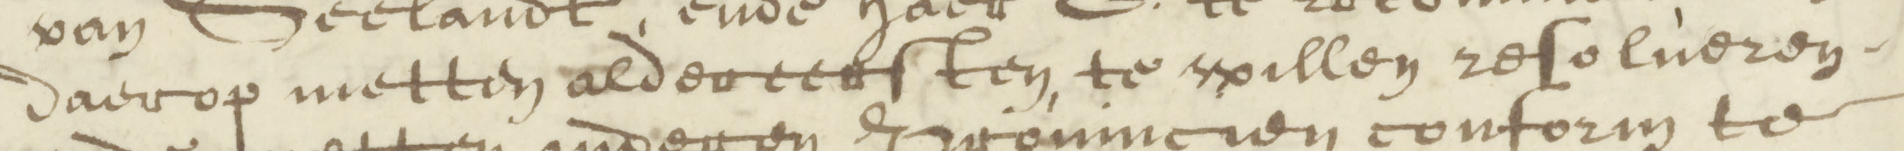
daerop metten aldereersten te willen resolueren
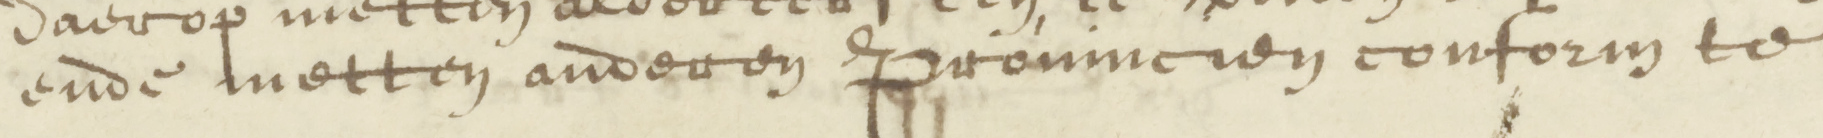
ende metten anderen Provincien conform te
